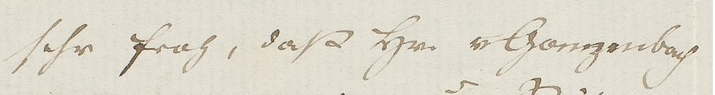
sehr froh, daß Hr v. Gonzenbach
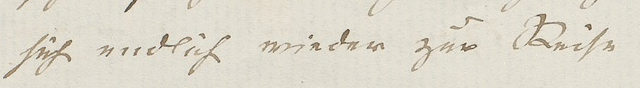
sich endlich wieder zur Reise
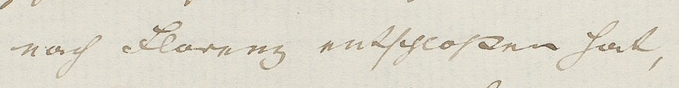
nach Florenz entschloßen hat,
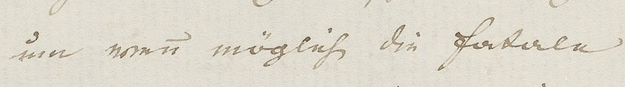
um wenn möglich die fatale
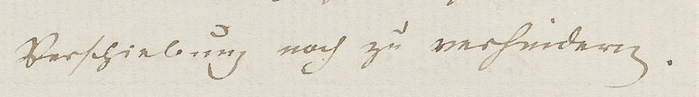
Verschiebung noch zu verhindern.
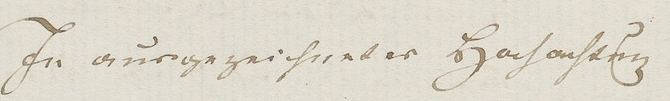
In ausgezeichneter Hochachtung
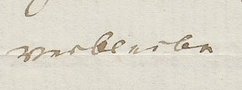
verbleibe
